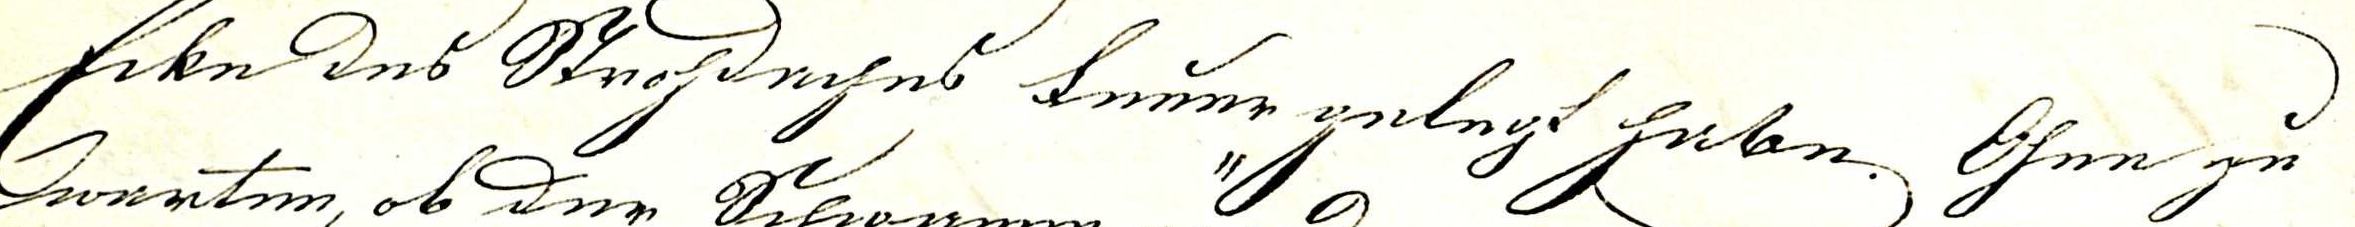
Ecke des Strohdaches Feuer gelegt habe. Ohne zu
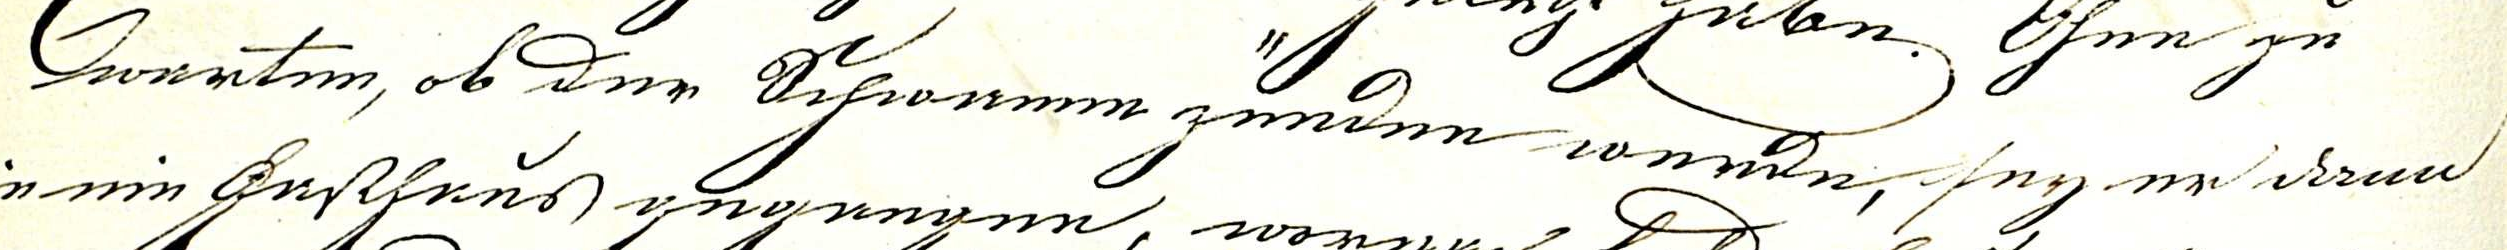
warten, ob der Schwamm zünden werde, sey er dann
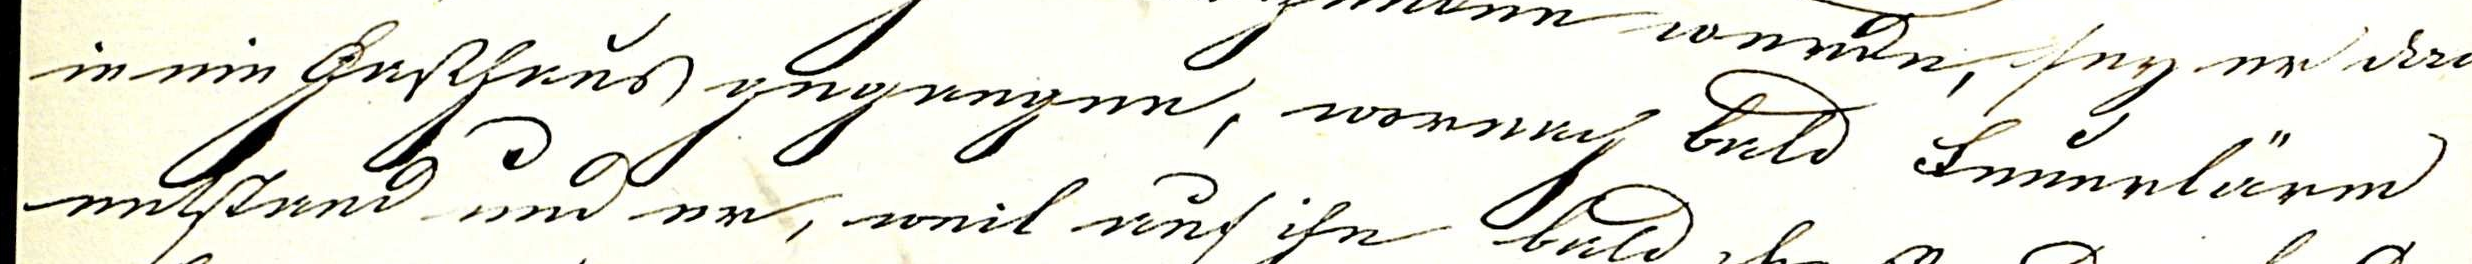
in ein Gasthaus gegangen, wornach bald Feuerlärm
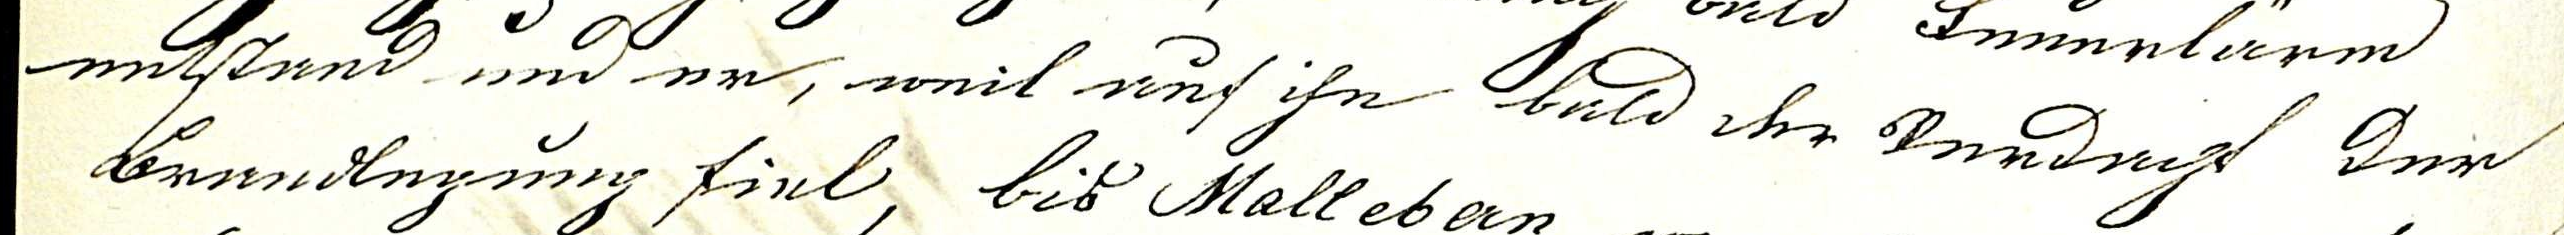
entstand und er, weil auf ihn bald ihr Verdacht der
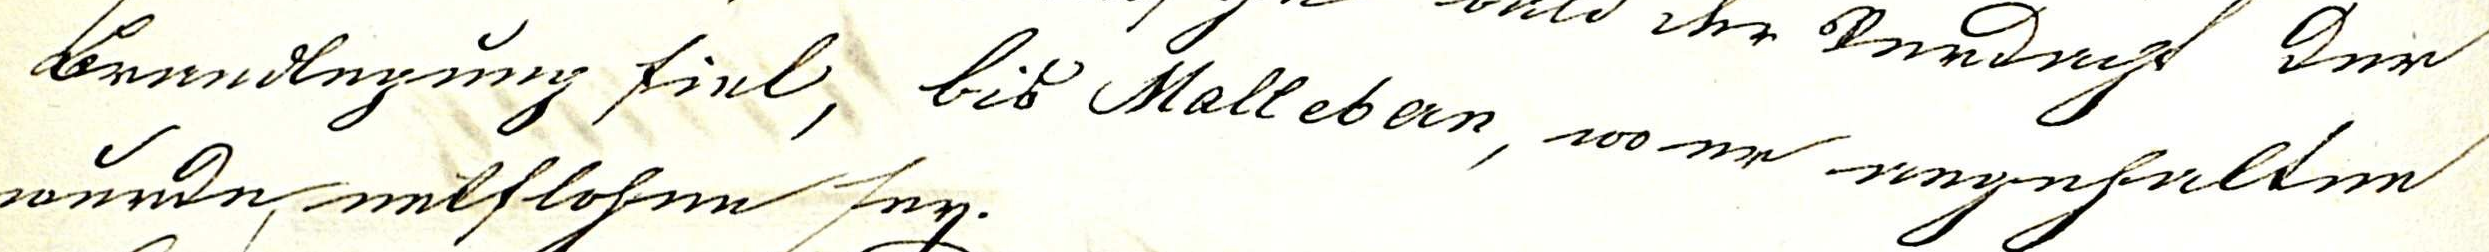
Brandlegung fiel, bis Malleban, wo er angehalten
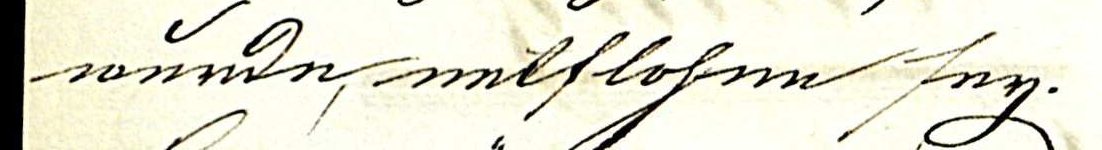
wurde, entflohen sey.
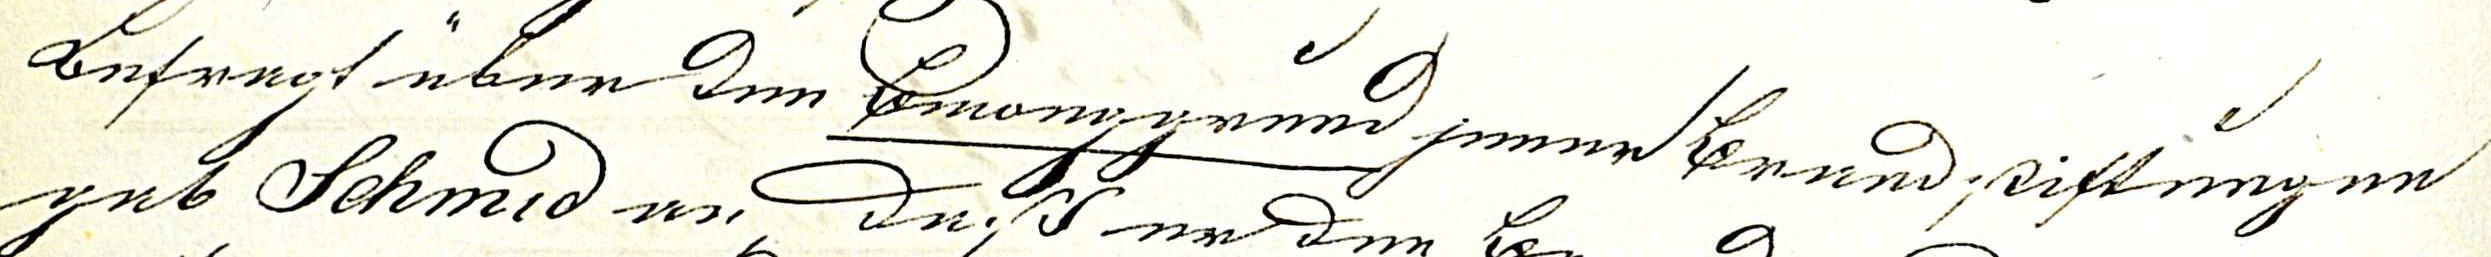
Befragt über den Beweggrund jener Brandstiftungen
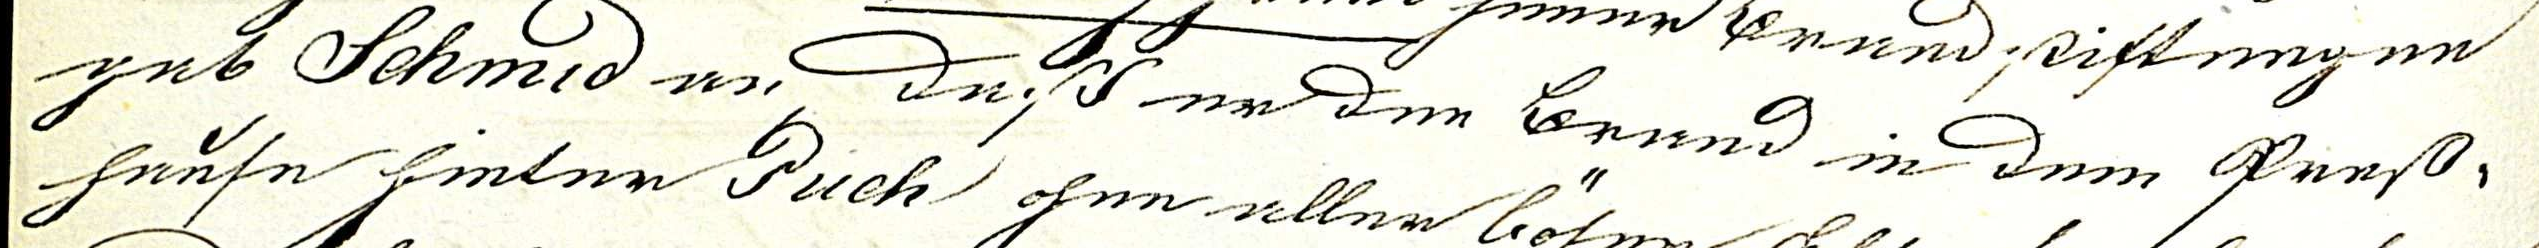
gab Schmid an, daß er den Brand in dem Preß¬
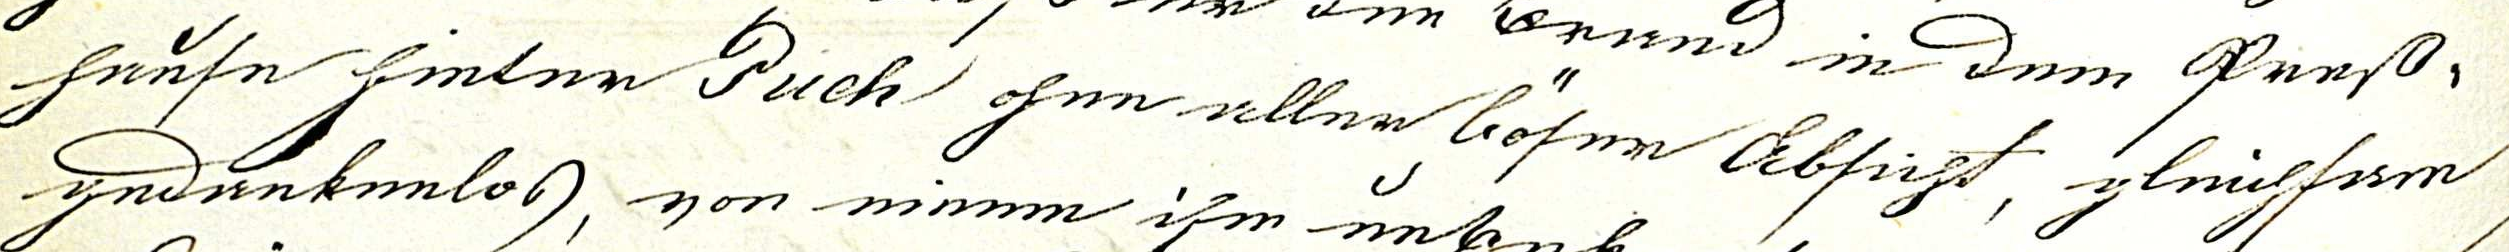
hause hinter Puch ohne aller böser Absicht, gleichsam
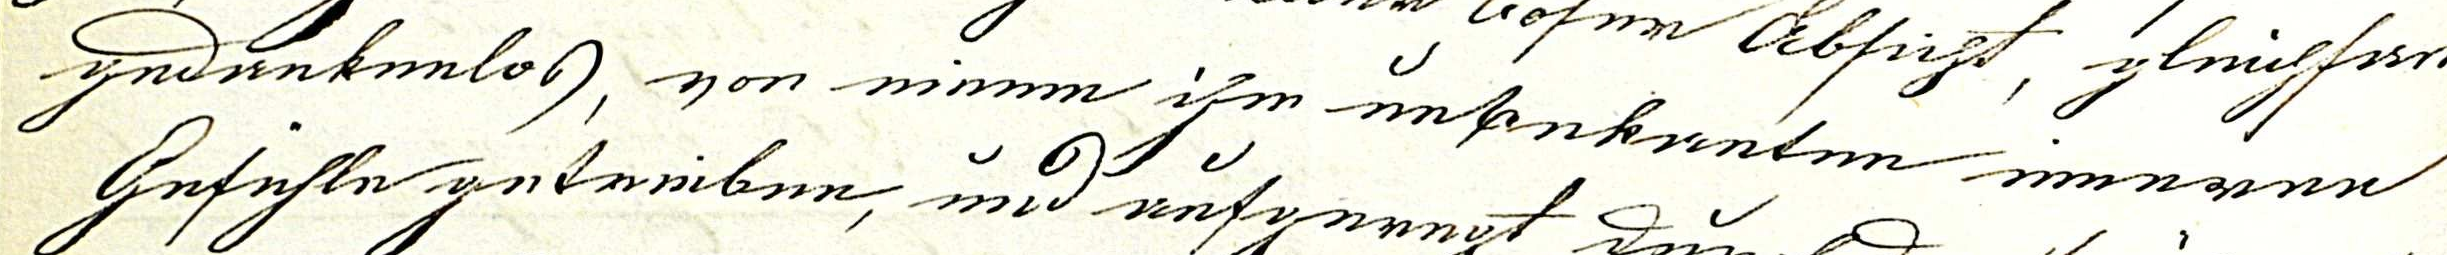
gedankenlos, von einem ihm unbekanten inneren
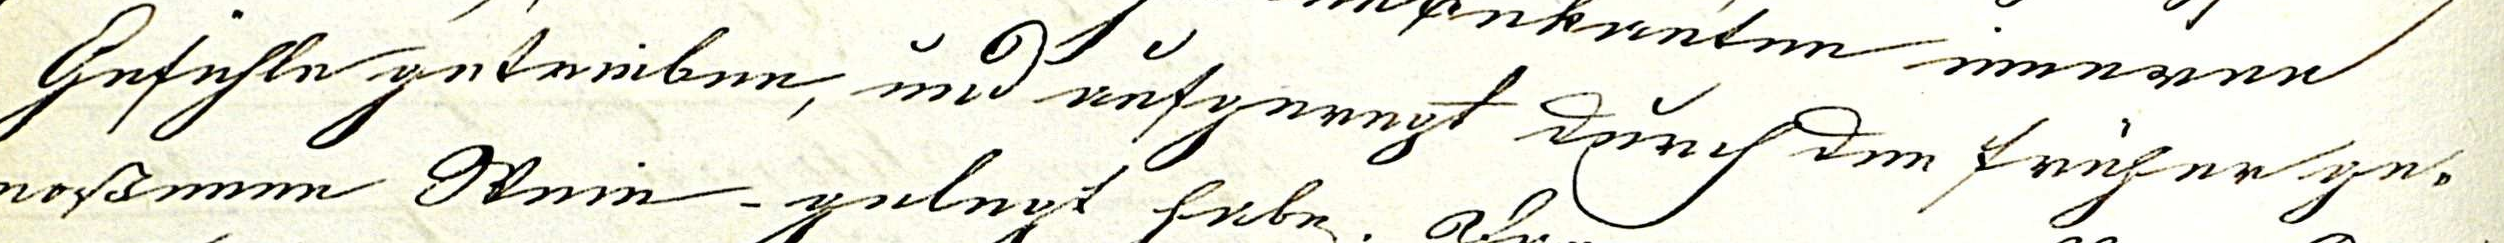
Gefühle getrieben, und aufgeregt durch dem früher ge¬
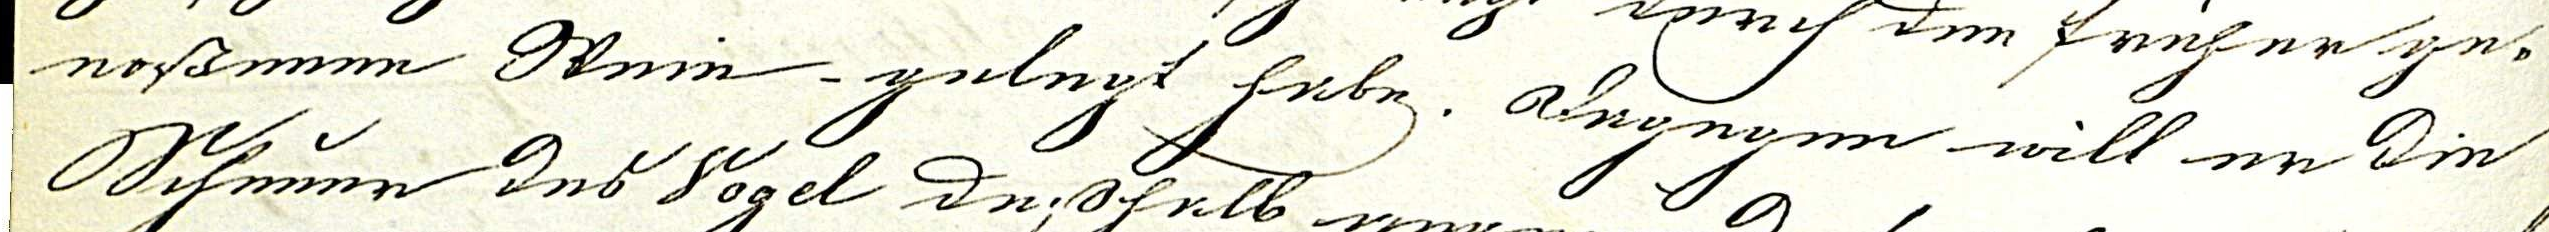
noßenen Wein gelegt habe. Dagagen will er die
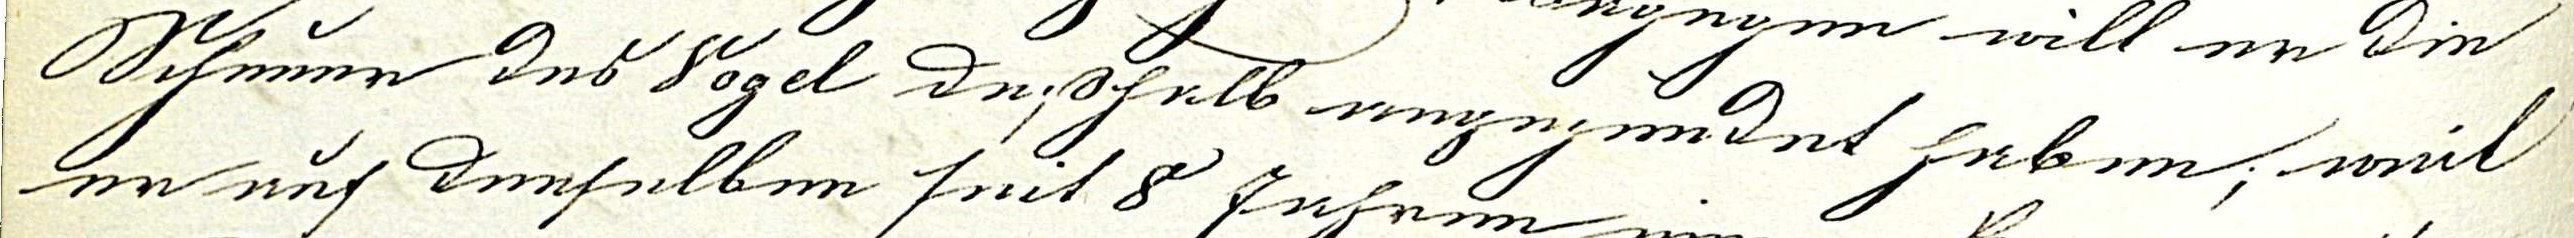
Scheune des Vogel deßhalb angezündet haben, weil
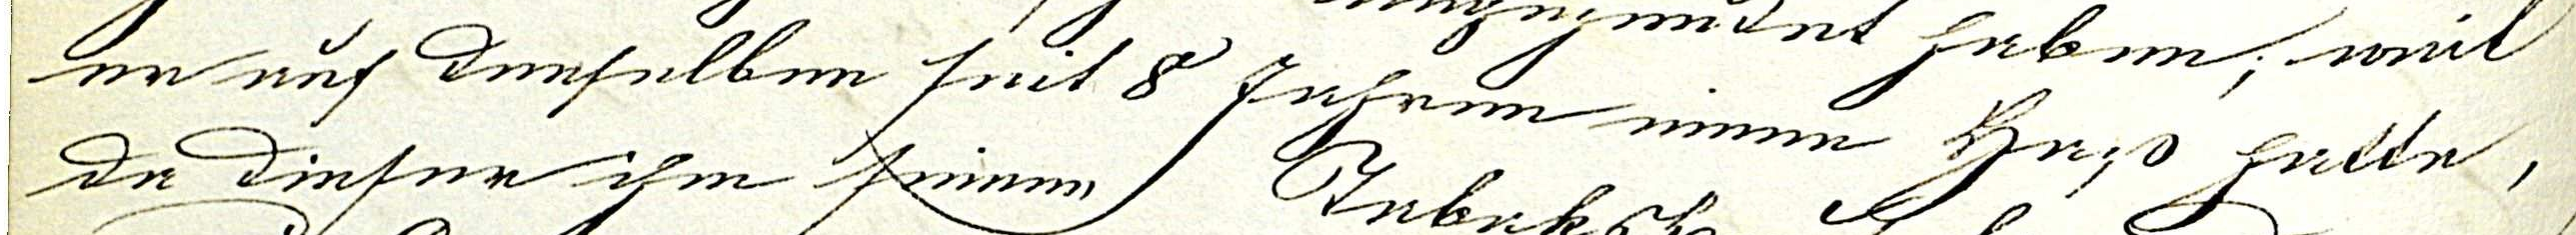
er auf denselben seit 8 Jahren einen Haß hatte,
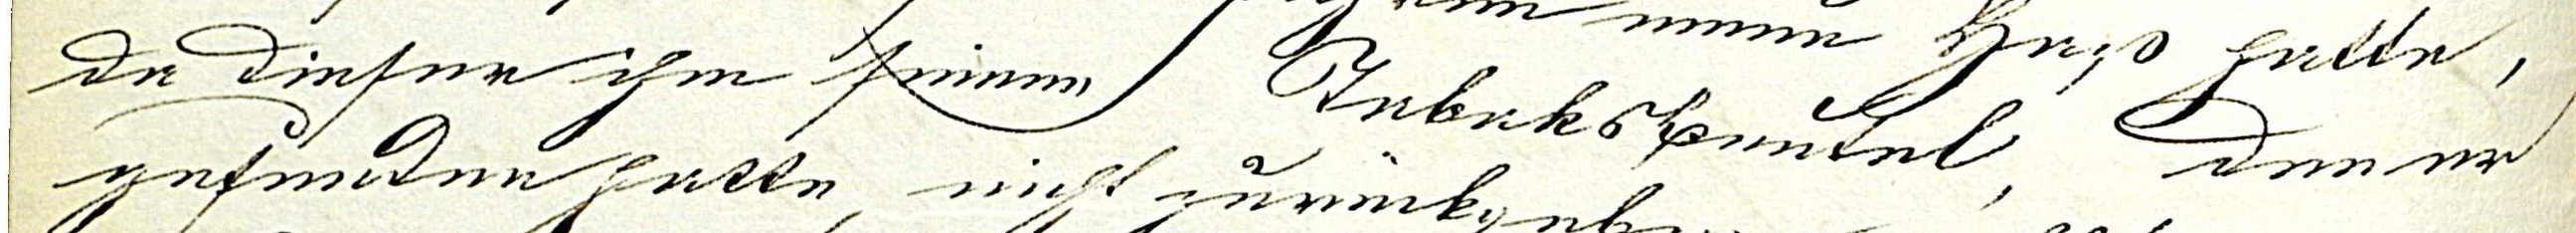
da dieser ihm seinem Tabaksbeutel, den er
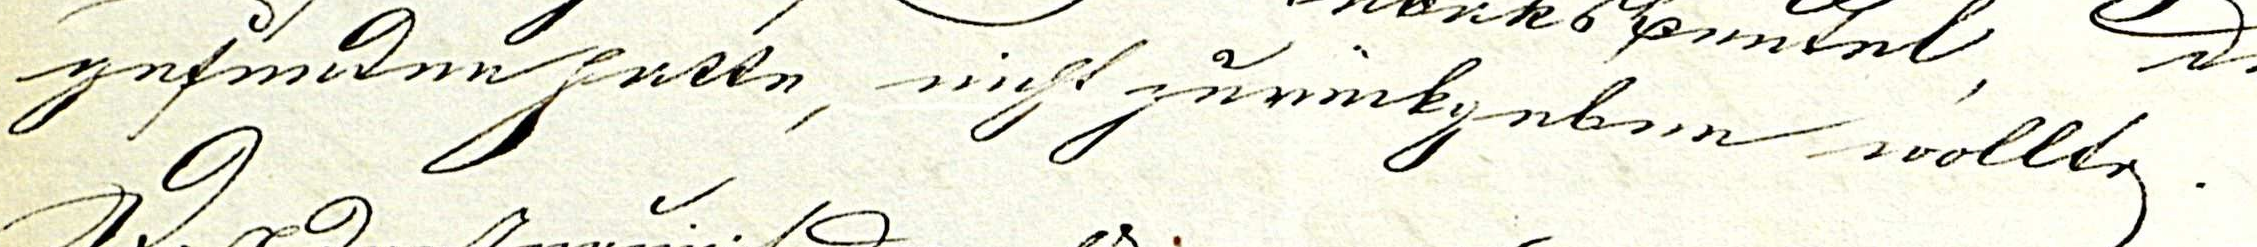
gefunden hatte, nicht zurückgeben wollte.
